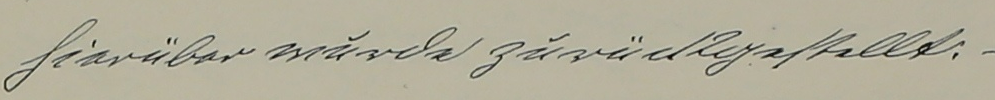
hierüber wurde zurückgestellt.
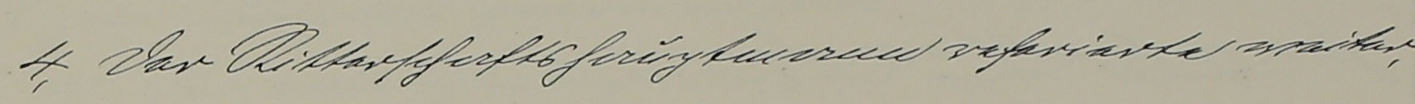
4. Der Ritterschaftshauptmann referierte weiter,
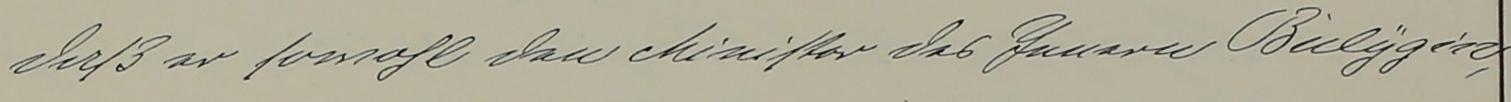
daß er sowohl den Minister des Innern Bulygin,
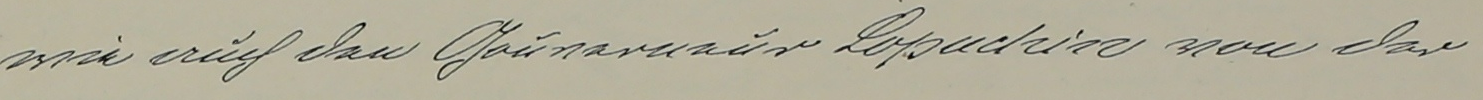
wie auch den Gouverneur Lopuchin von der
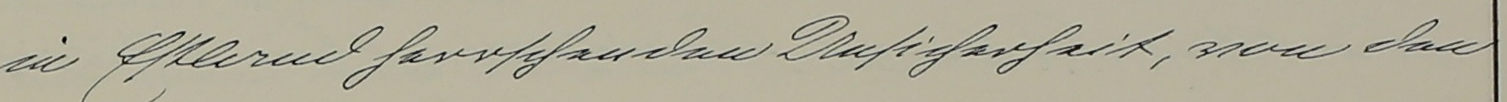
in Estland herrschenden Unsicherheit, von den
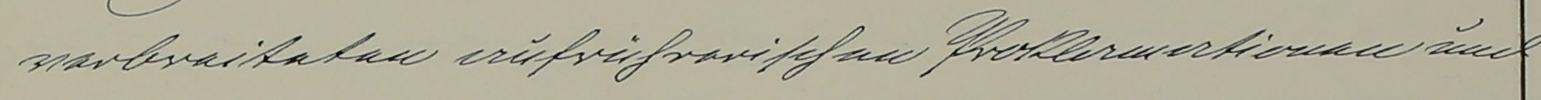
verbreiteten aufrührerischen Proklamationen und
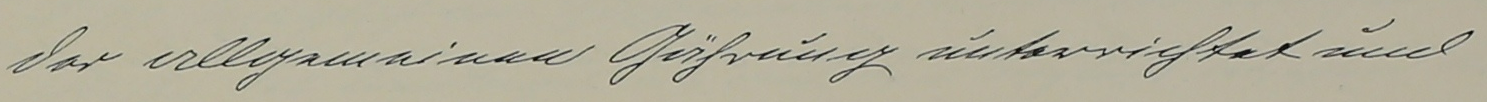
der allgemeinen Gährung unterrichtet und
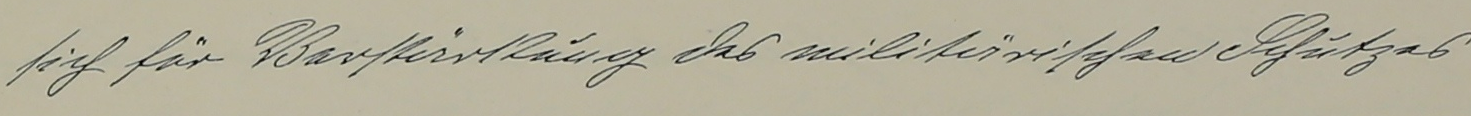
sich für Verstärkung des militärischen Schutzes
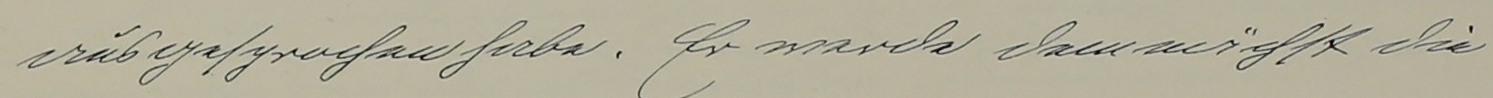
ausgesprochen habe. Er werde demnächst die
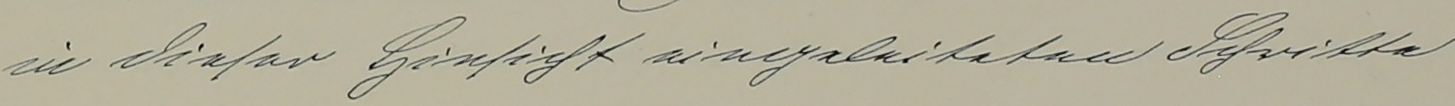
in dieser Hinsicht eingeleiteten Schritte
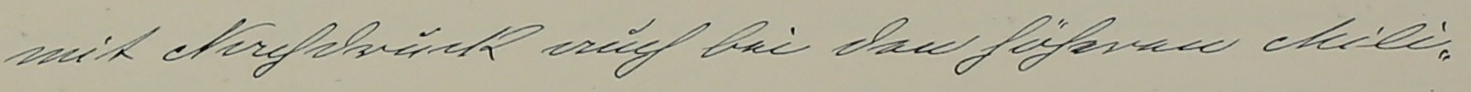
mit Nachdruck auch bei den höheren Mili-
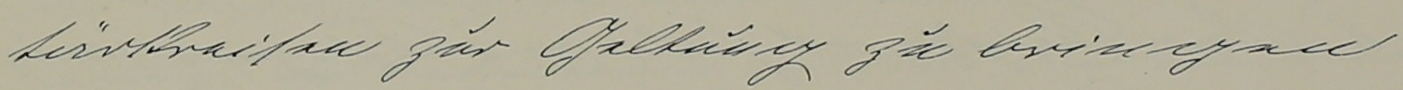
tärkreisen zur Geltung zu bringen
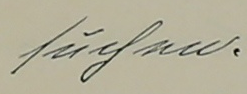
suchen.
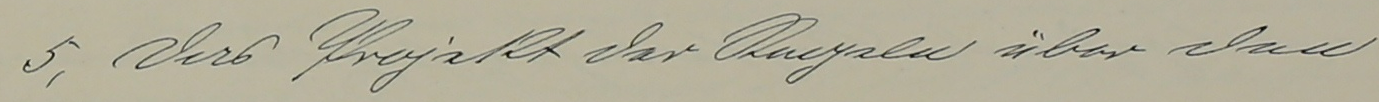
5. Das Projekt der Regeln über den
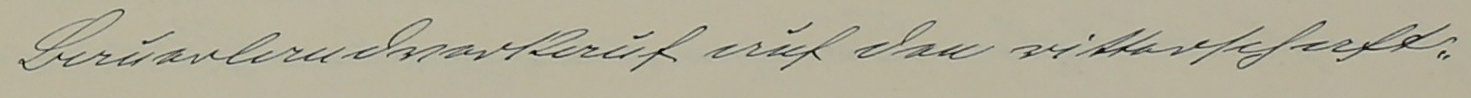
Bauerlandverkauf auf den ritterschaft-
